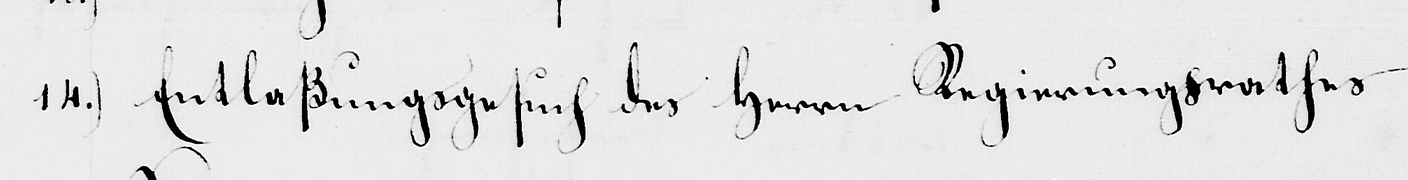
14.) Entlaßungsgesuch des Herrn Regierungsrathes
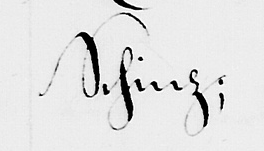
Schinz;
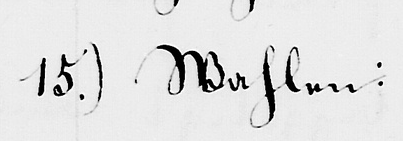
15.) Wahlen:
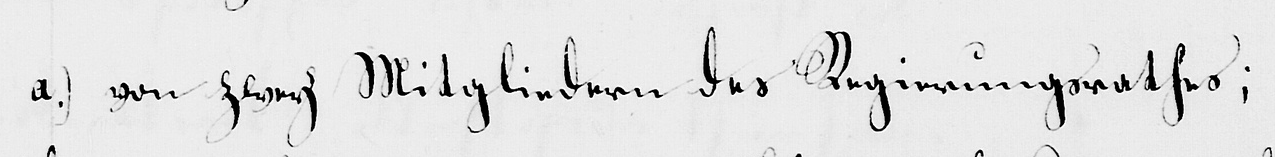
a.) von zwey Mitgliedern des Regierungsrathes;
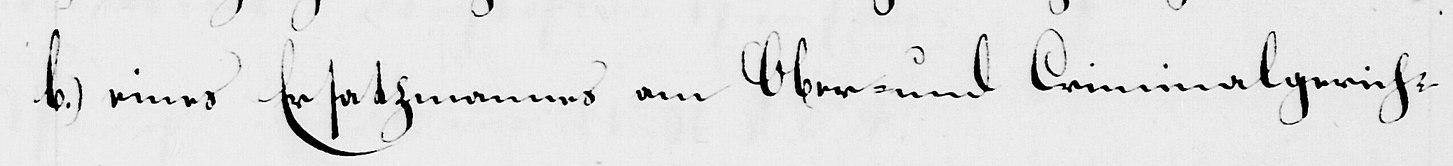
b.) eines Ersatzmannes am Ober- und Criminalgerich¬
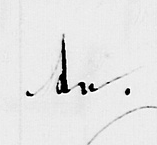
te.
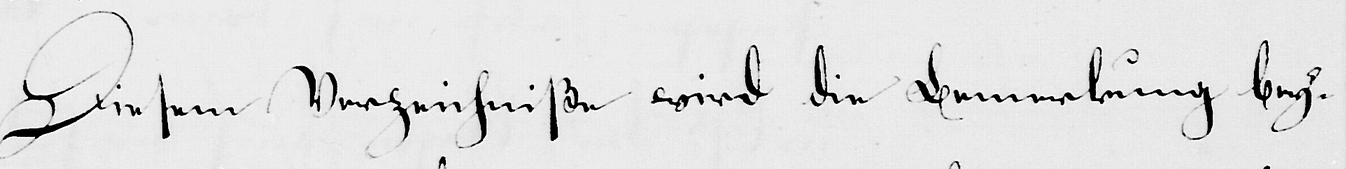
Diesem Verzeichniße wird die Bemerkung bey¬
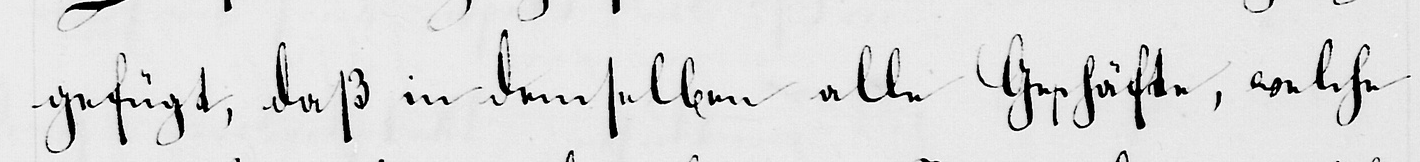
gefügt, daß in denselben alle Geschäfte, welche
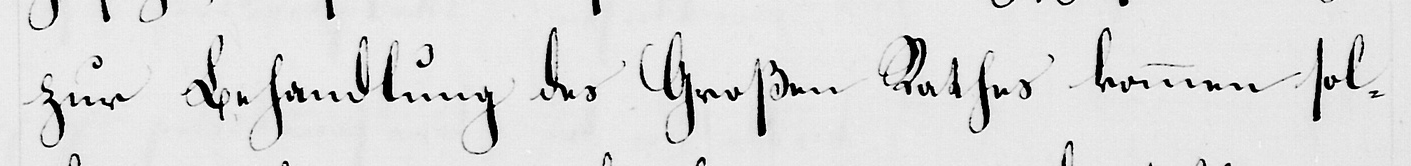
zur Behandlung des Großen Rathes kommen sol¬
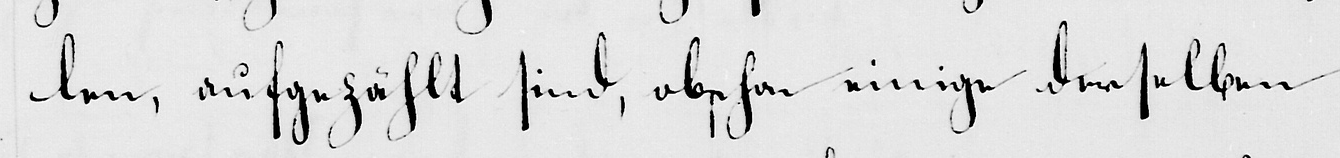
len, aufgezählt sind, obschon einige derselben
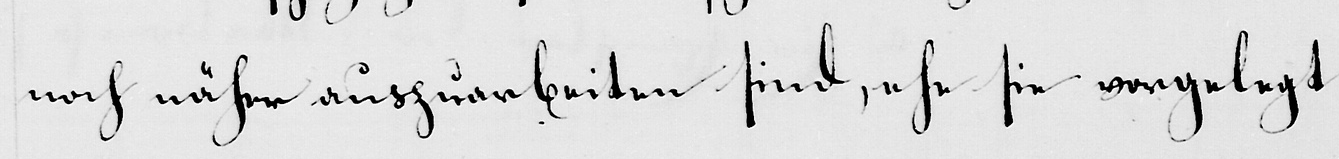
noch näher auszuarbeiten sind, ehe sie vorgelegt
